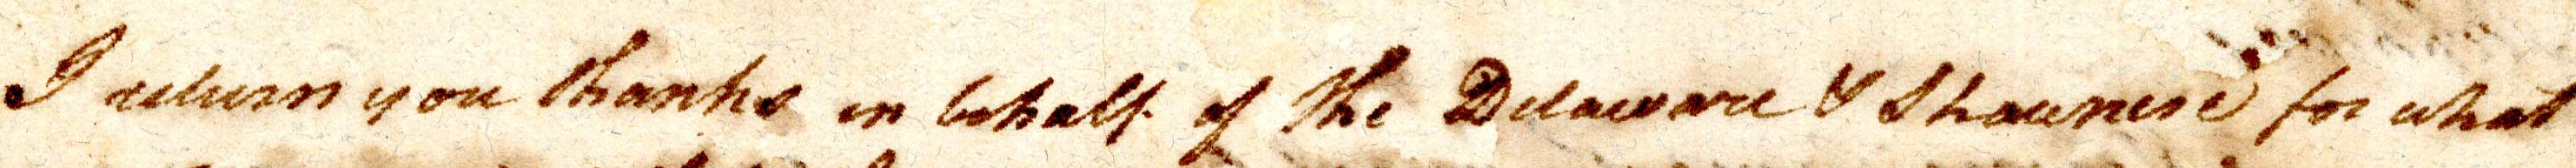I return you thanks on behalf of the Delaware & Shawnese for what
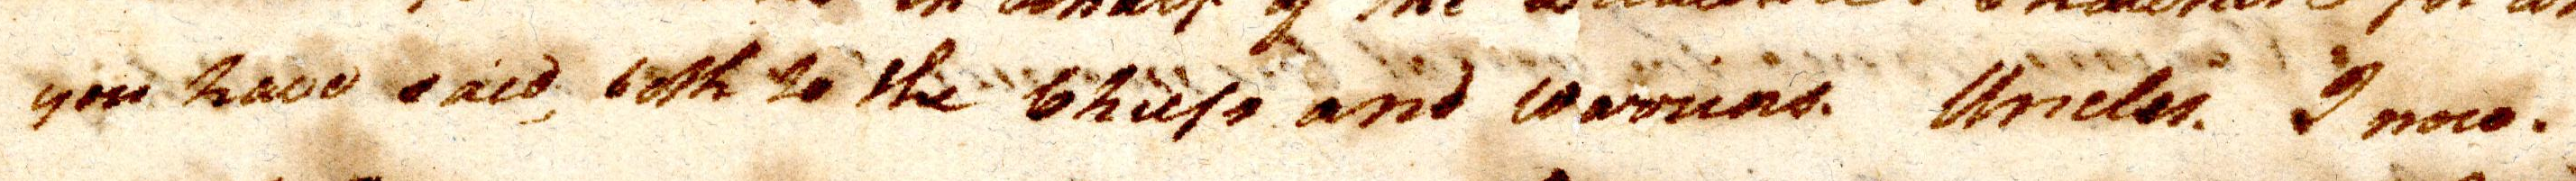you have said, both to the Chiefs and Warriors. Uncles. I now
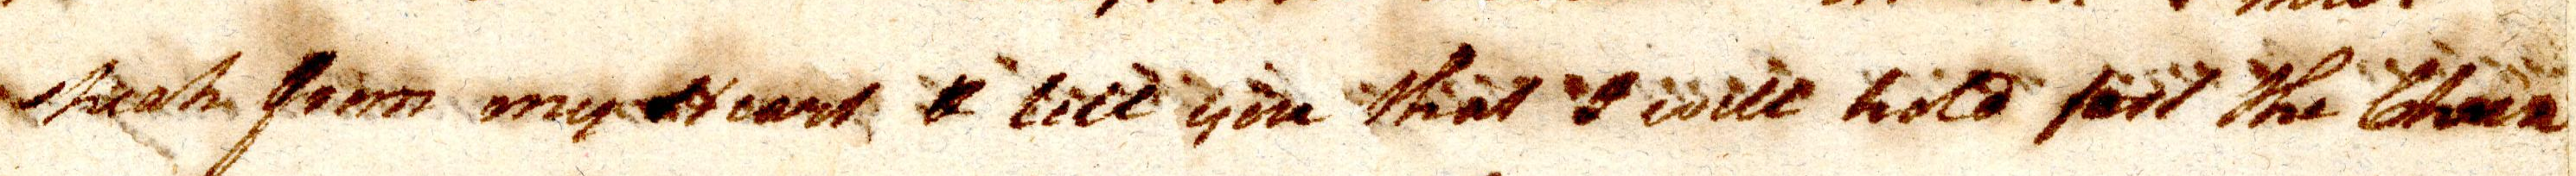speak from my Heart, & tell you that I will hold fast the Chain
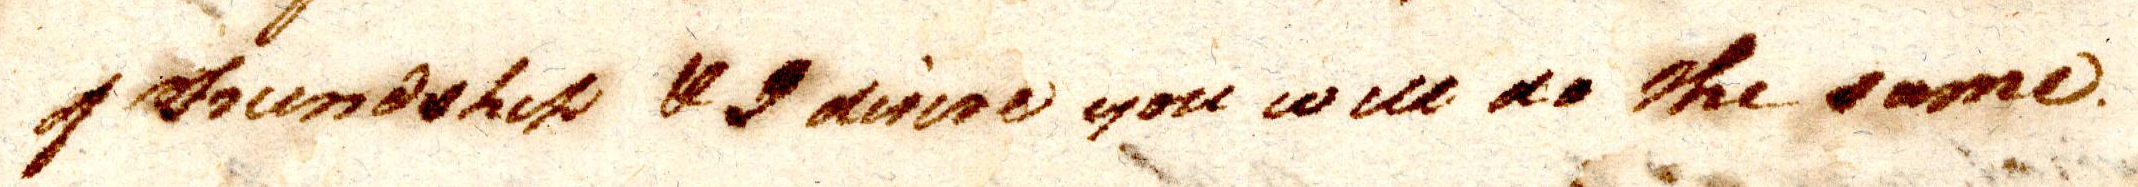of Friendship & I desire you will do the same.
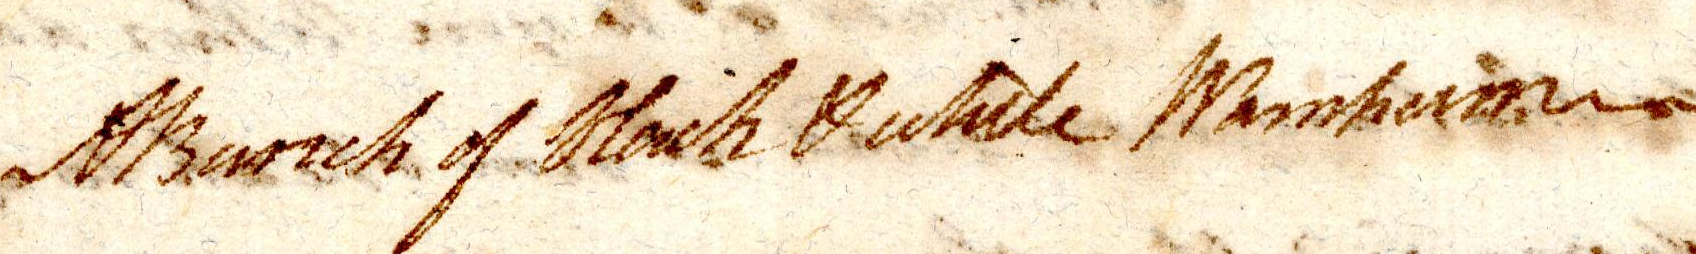A bunch of Black & white Wampum
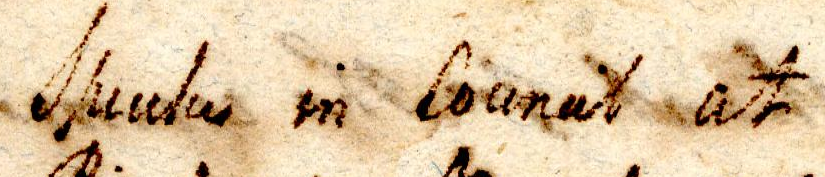Speeches in Council at
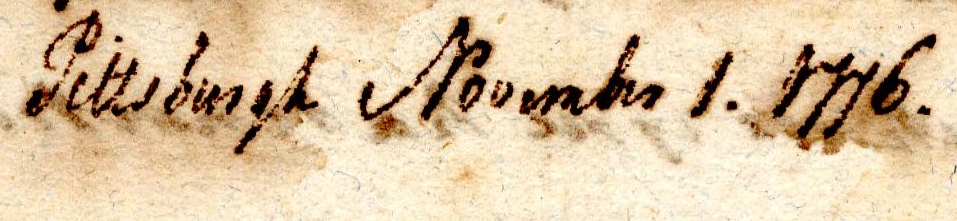Pittsburgh November 1. 1776.
